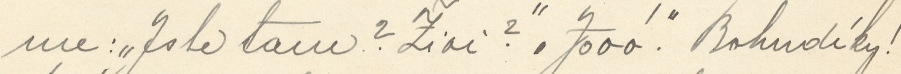me: „Jste tam? Živi? Jooó.“ Bohudíky!
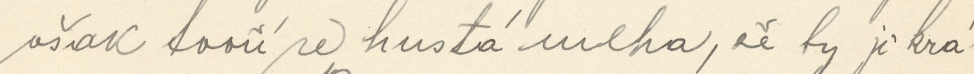však tvoří se hustá mlha, že by ji krá-
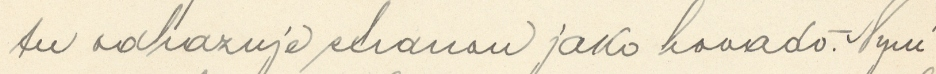tu odhazuje stranou jako hovado. Nyní
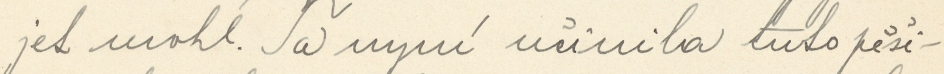jet mohl. Ta nyní učinila tuto pěši-
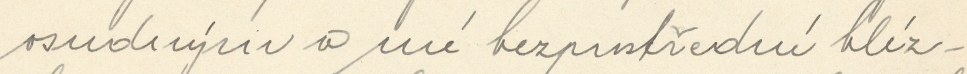osudným v mé bezprostřední blíz-
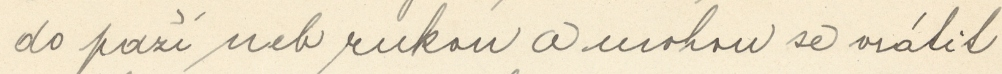do paží neb rukou a mohou se vrátit
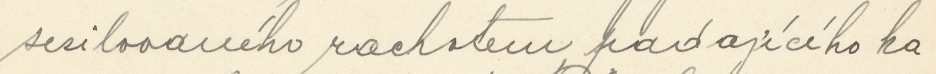zesilovaného rachotem padajícího ka-
